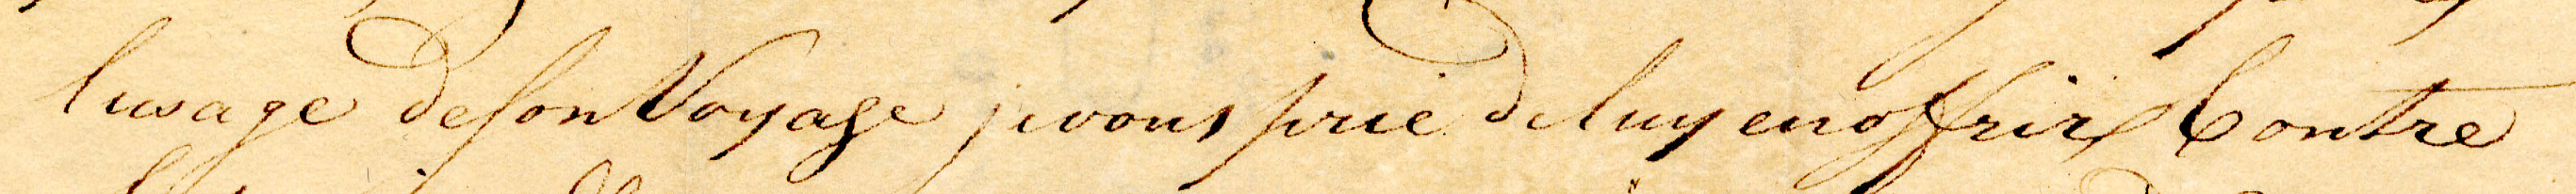lusage de son Voyage je vous prie de luy en offrir Contre
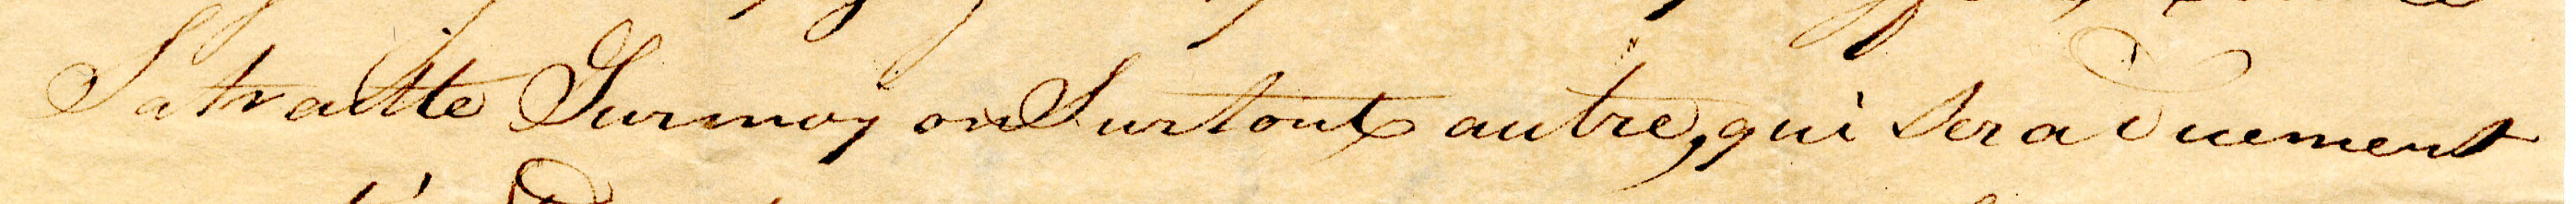Sa traitte Surmoy on Surtout autre, qui sera duement
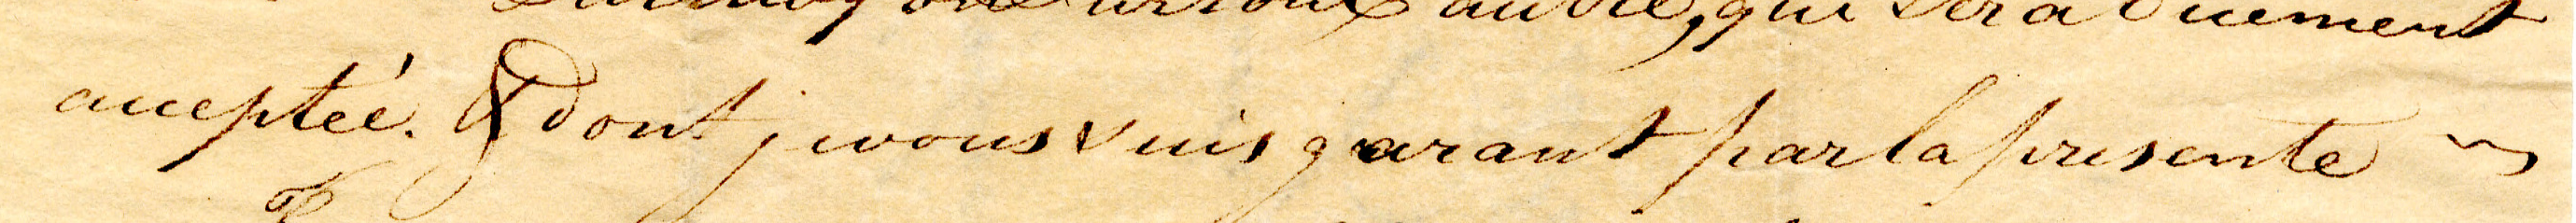acceptée. & dont je vous suis garant par la presente-
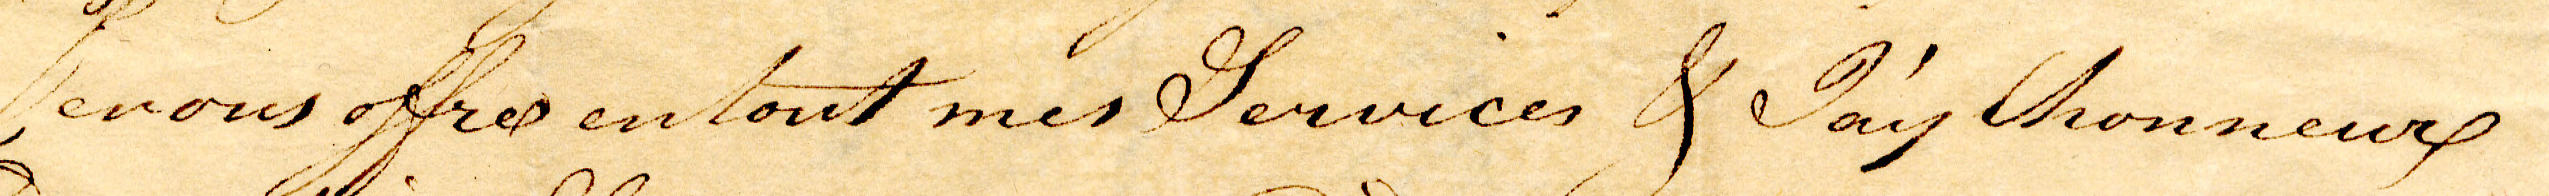Je vous offres en tout mes Services & J'ay honneur
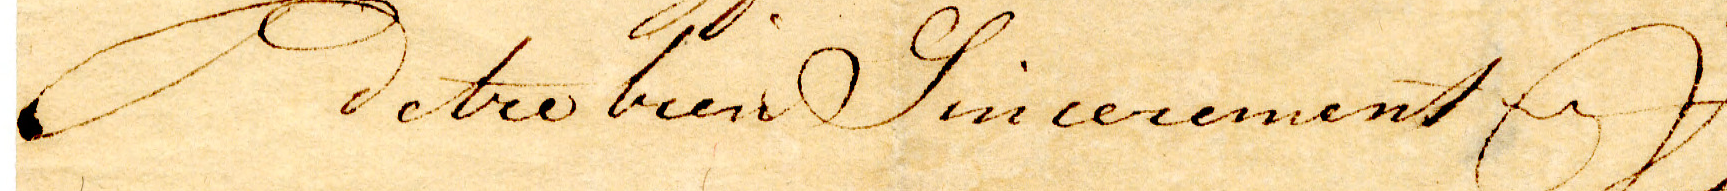detre bien Sincerement
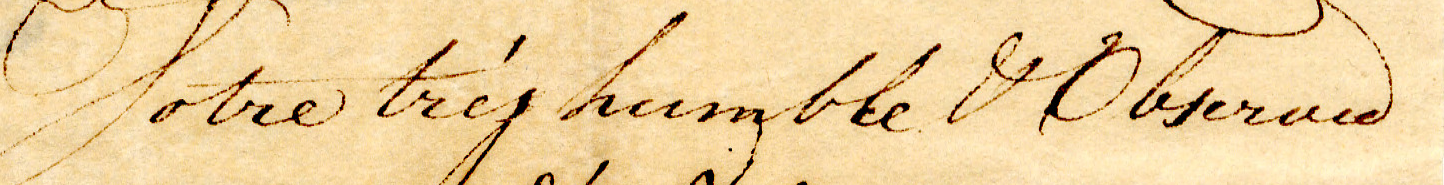Votre trés humble & Observee
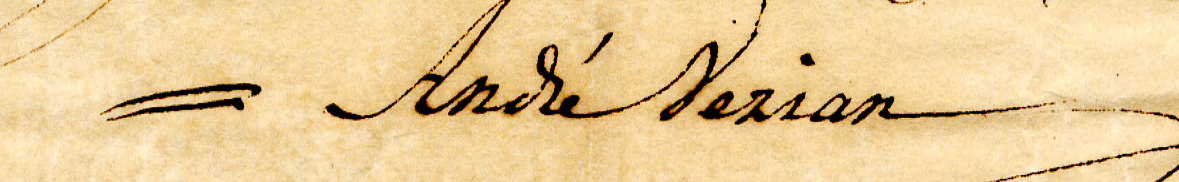André Nezian
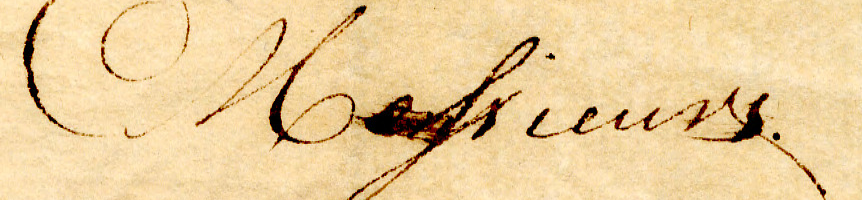Messieurs.
